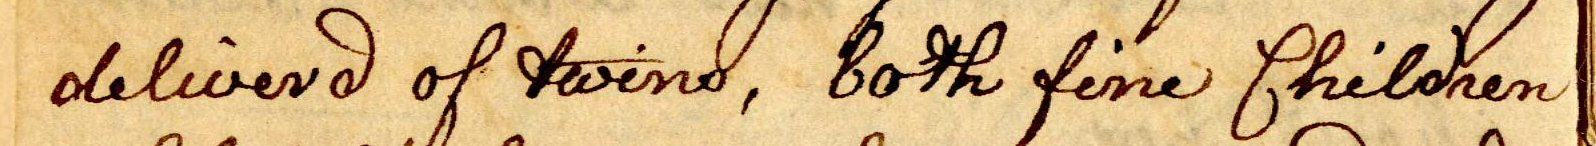deliverd of twins, both fine Children
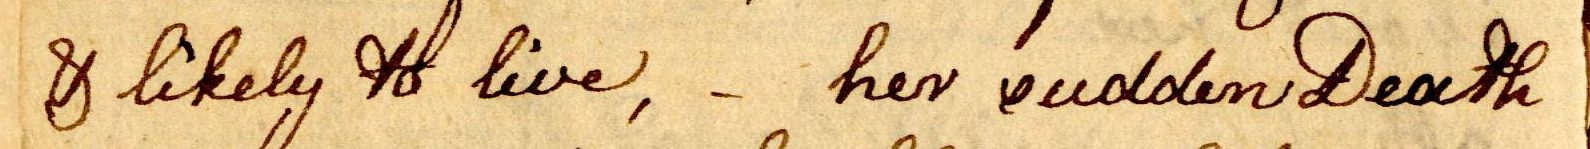& likely to live,- her sudden Death
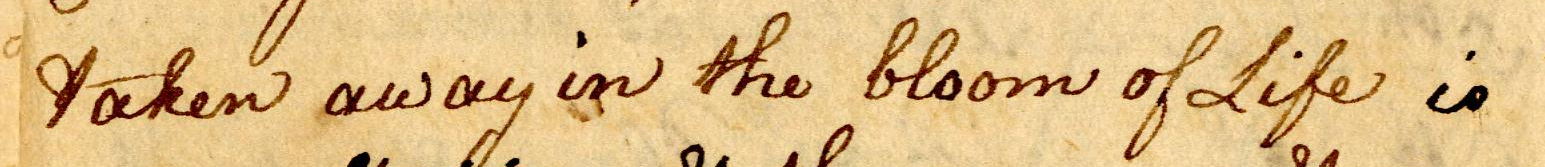taken away in the bloom of Life is
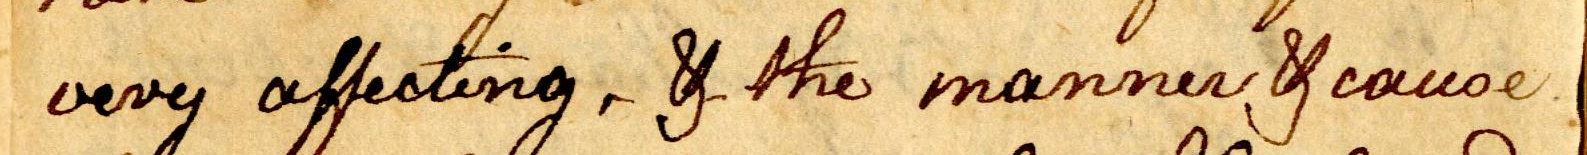very affecting, & the manner, & cause
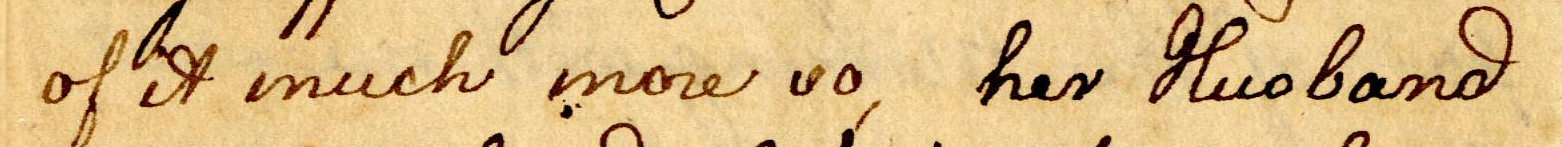of it much more so, her Husband
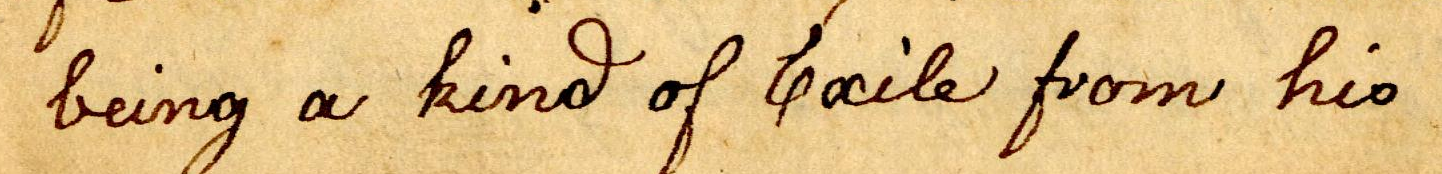being a kind of Exile from his
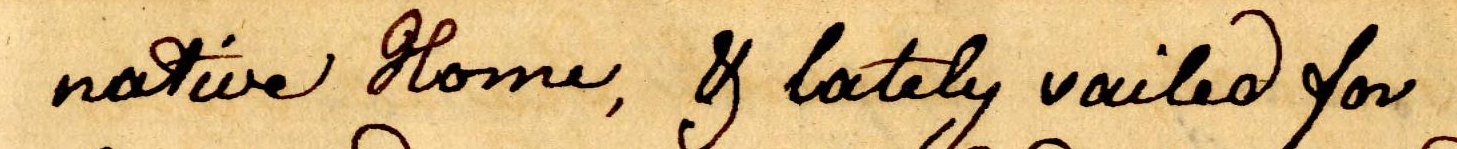native Home, & lately sailed for
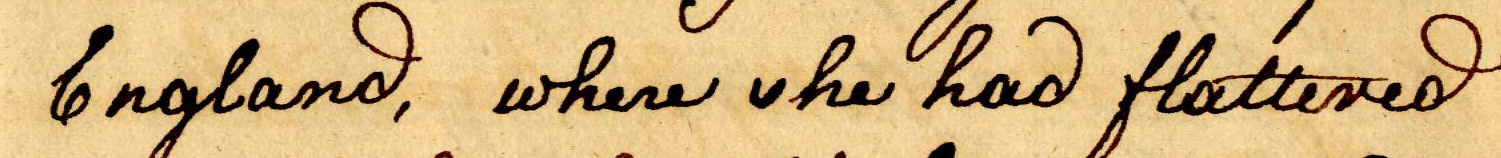England, where she had flattered
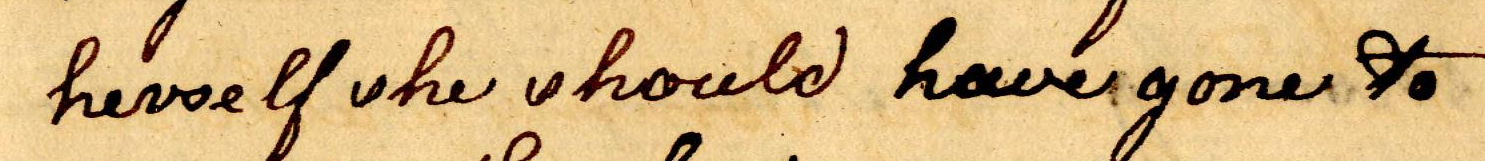herself she should have gone to
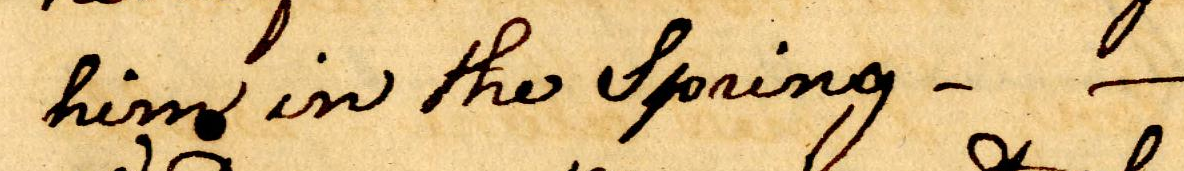him, in the Spring--
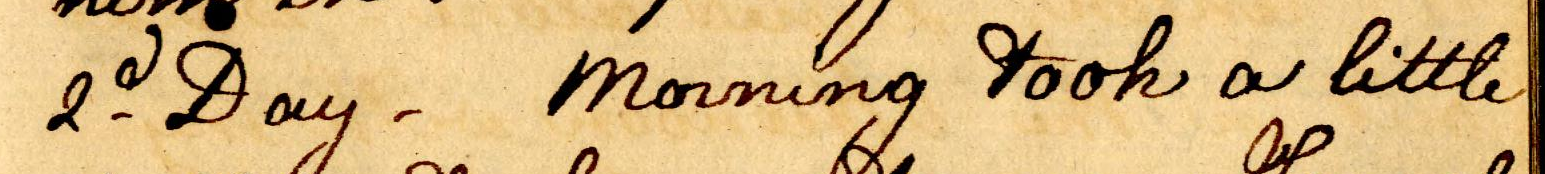2^d Day- Morning took a little
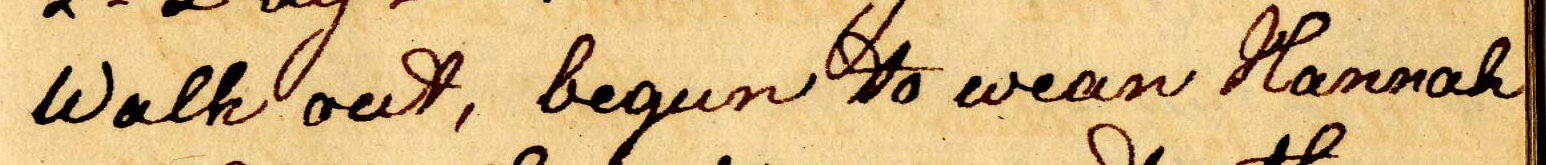Walk out, begun to wean Hannah
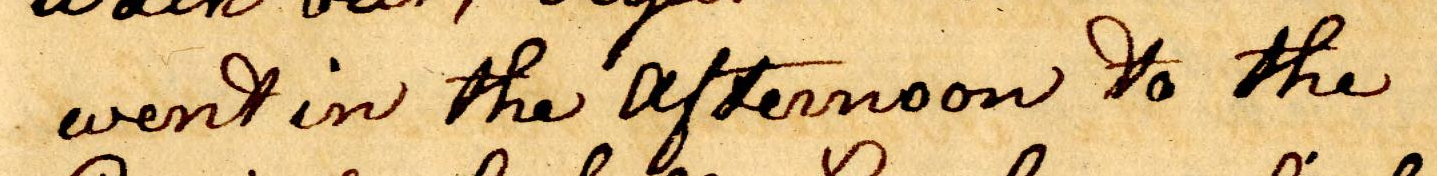event in the Afternoon to the
